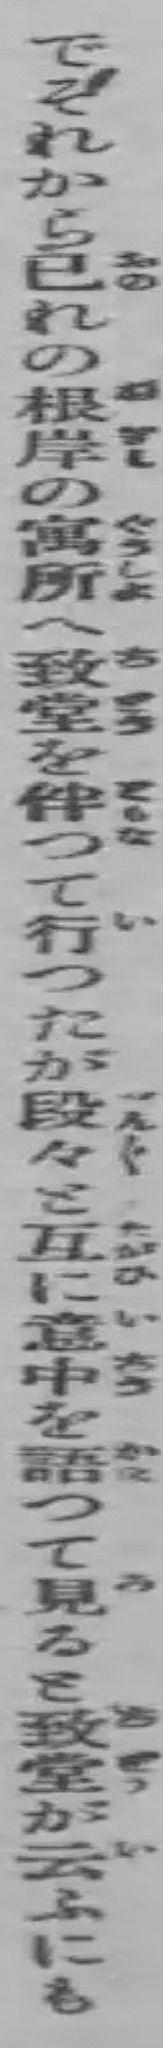でそれから巳れの根岸の寓所へ致堂を伴つて行つたが段々と互に意中を語つて見ると致堂が云ふにも
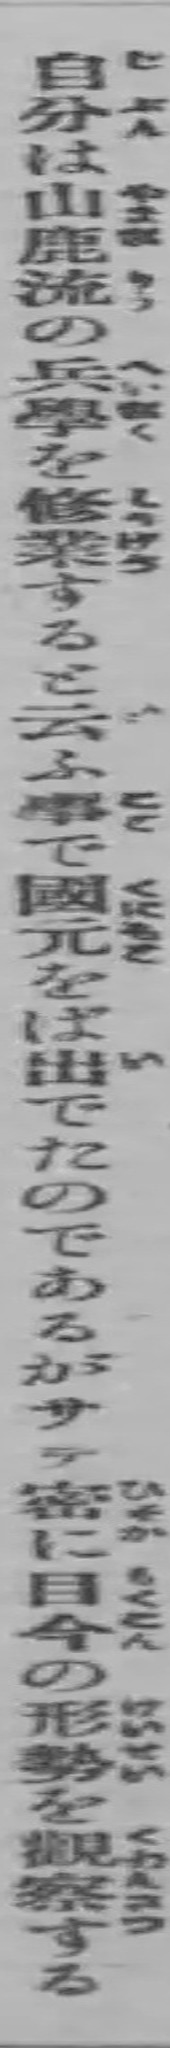自分は山鹿流の兵学を修行すると云ふ事で国元をば出でたのであるがサテ密に目今の形勢を観察する
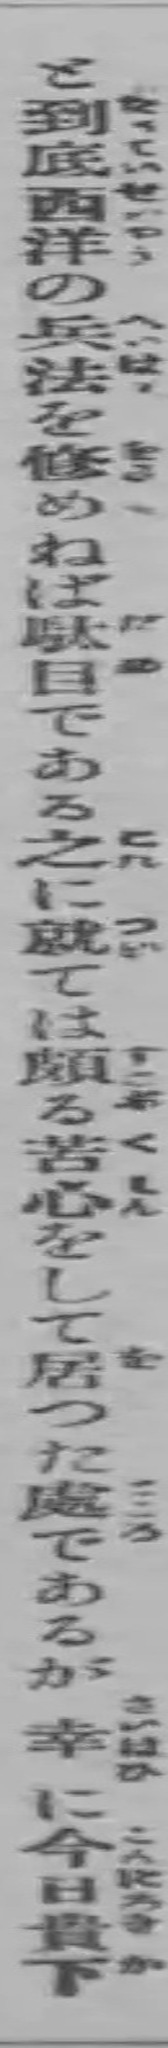と到底西洋の兵法を修めねば駄目である之に就ては頗る苦心をして居つた処であるが幸に今日貴下
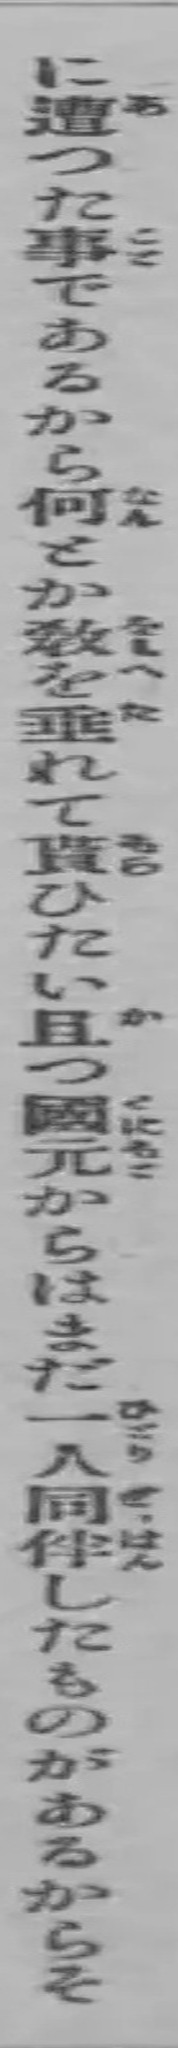に遭つた事であるから何とか教を垂れて貰ひたい且つ国元からはまだ一人同伴したものがあるからそ
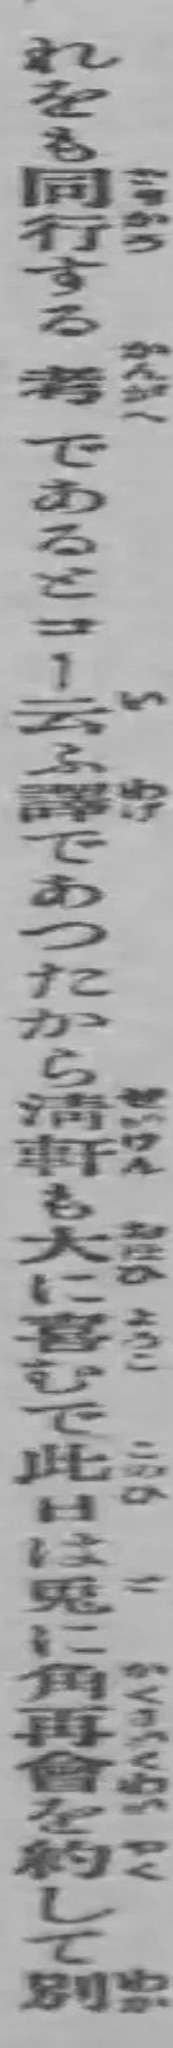れをも同行する考であるとコー云ふ訳であつたから清軒も大に喜むで此日は兎に角再会を約して別
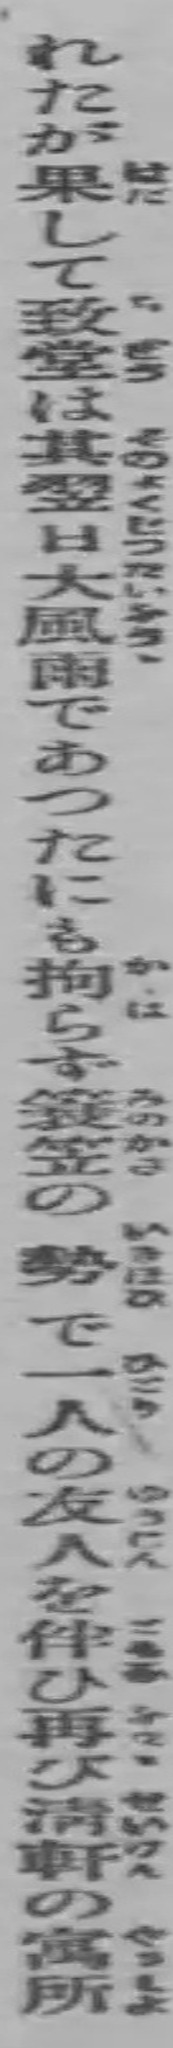れたが果して致堂は其翌日大風雨であつたにも拘らず蓑笠の勢で一人の友人を伴ひ再び清軒の寓所
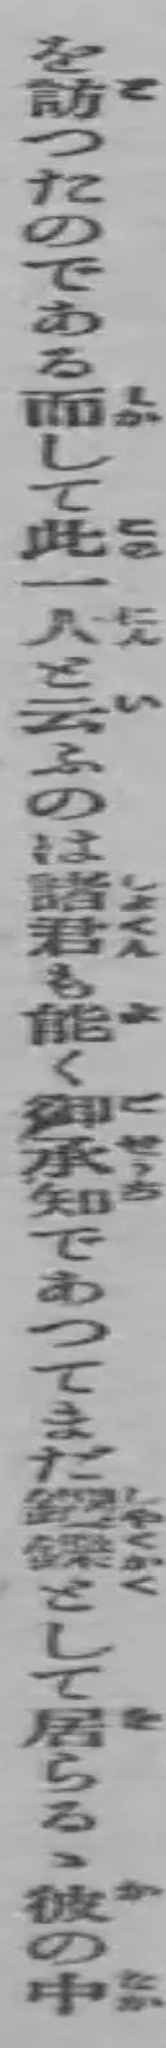を訪つたのである而して此一人と云ふのは諸君も能く御承知であつてまだ钁鑠として居らるゝ彼の中
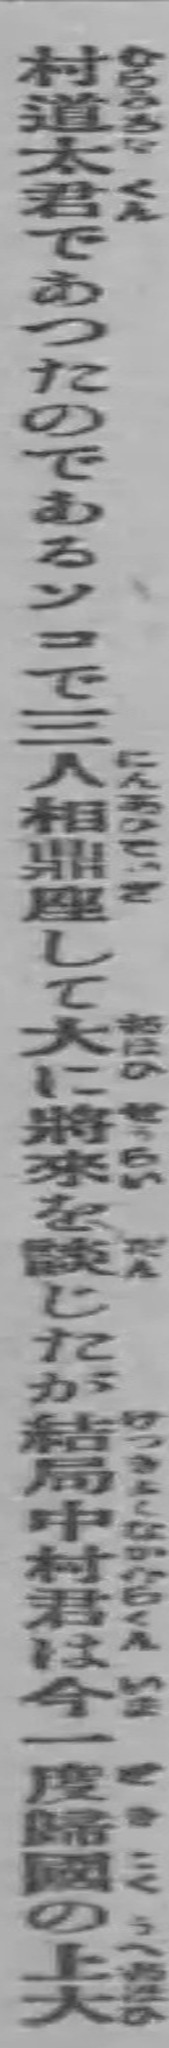村道太君であつたのであるソコで三人相鼎座して大に将来を談じたが結局中村君は今一度帰国の上大

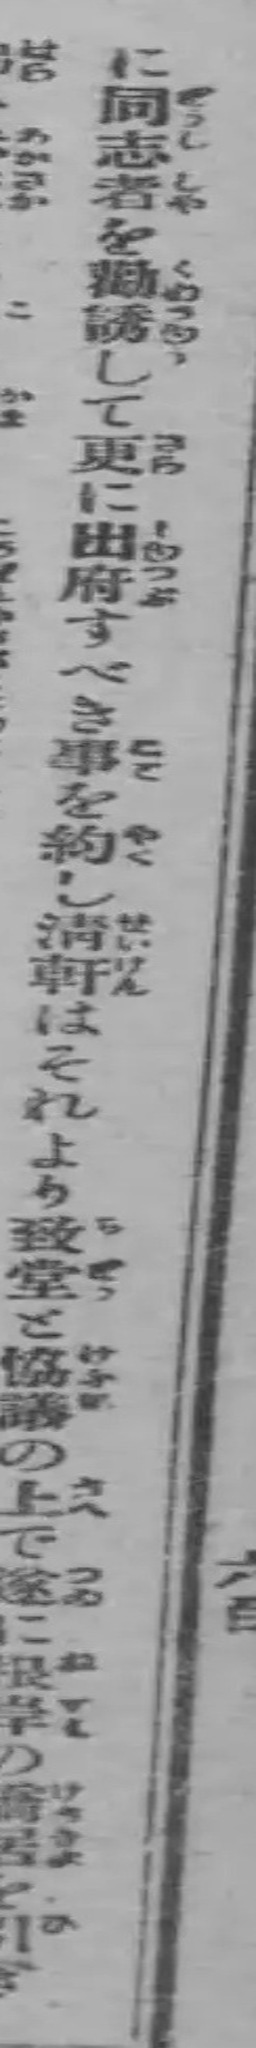に同志者を勧誘して更に出府すべき事を約し清軒はそれより致堂と協議の上で遂に根岸の僑居を引き
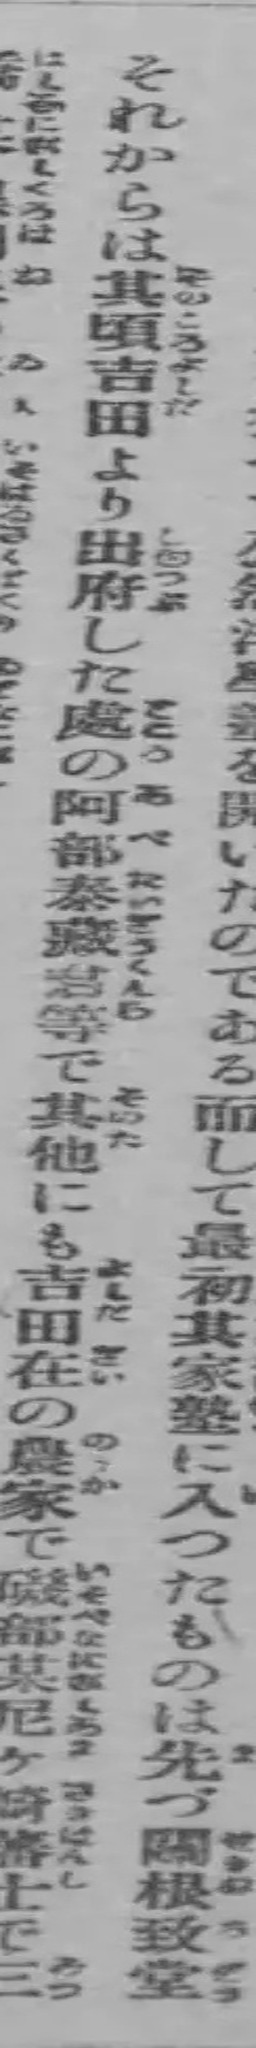それからは其頃吉田より出府した処の阿部泰蔵君等で其他にも吉田在の農家で磯部某尼ケ崎藩士で三
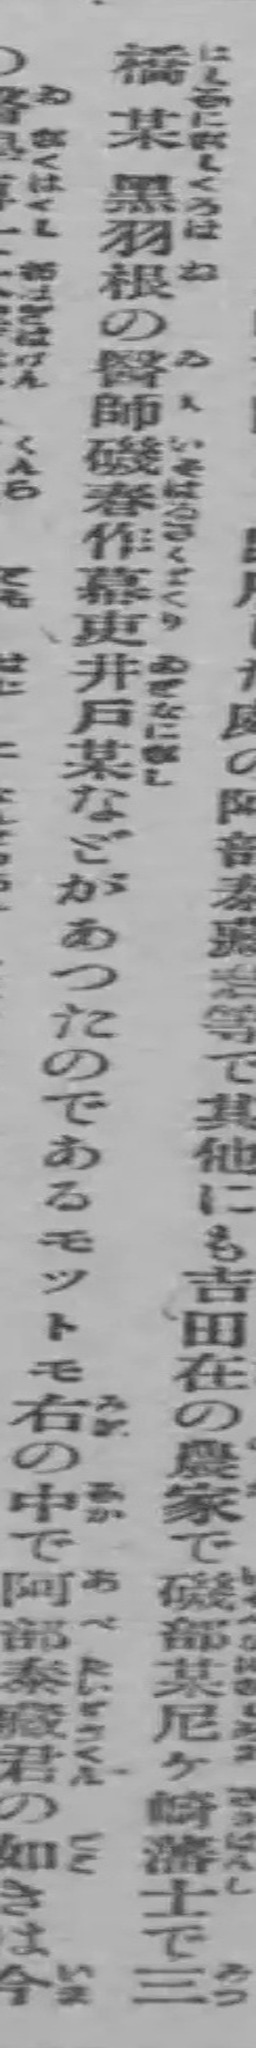橋某黒羽の医師磯春作幕吏井戸某などがあつたのであるモツトモ右の中で阿部泰蔵君の如きは今
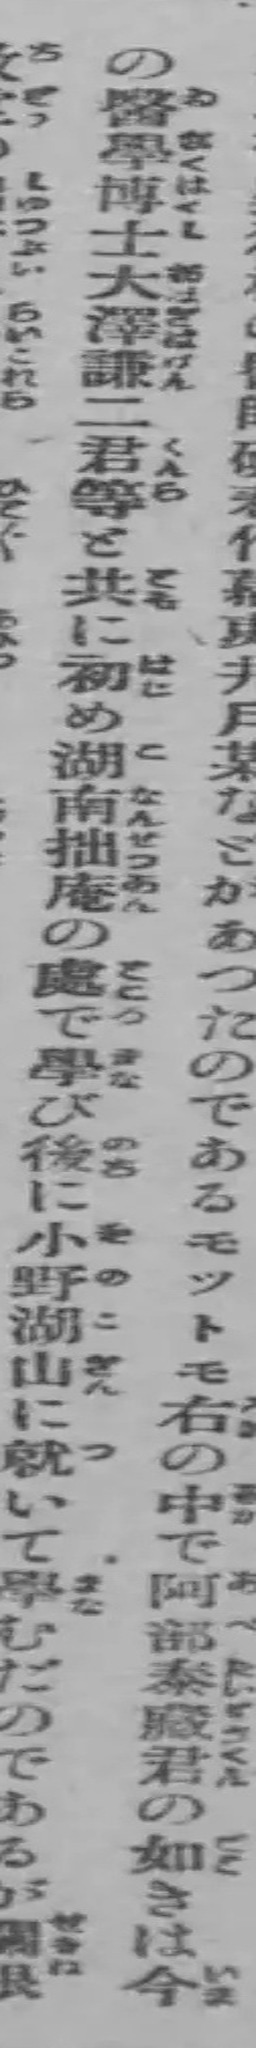の医学博士大澤健二君等と共に初め湖南拙庵の処で学び後に小野湖山に就いて学むだのであるが関根
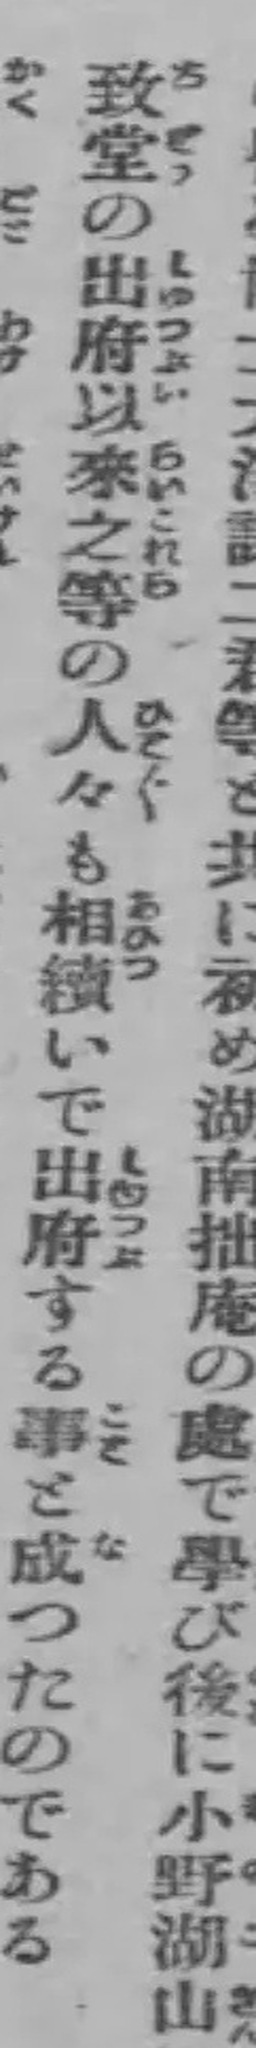致堂の出府以来之等の人々も相続いで出府する事と成つたのである
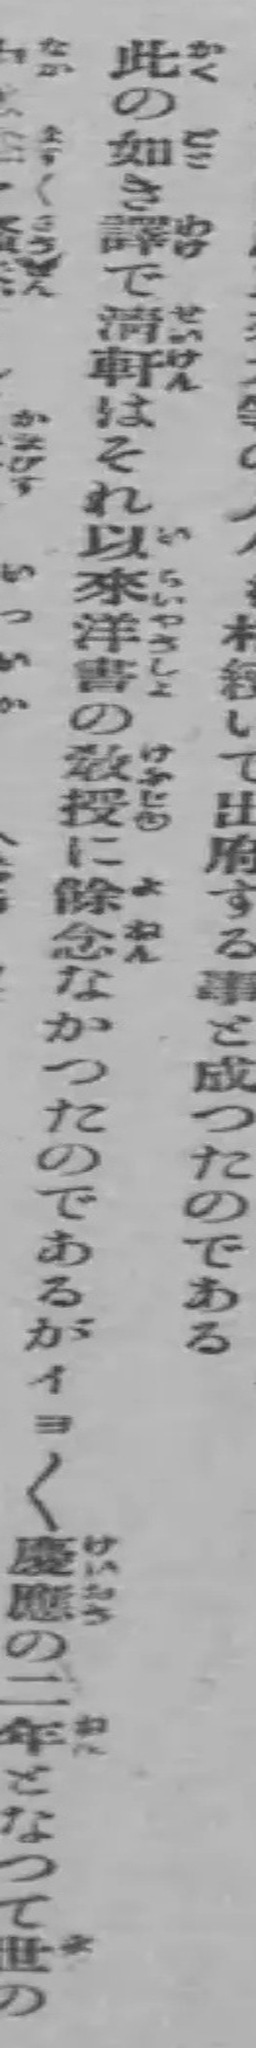此の如き訳で清軒はそれ以来洋書の教授に余念なかつたのであるがイヨ〳〵慶応の二年となつて世の
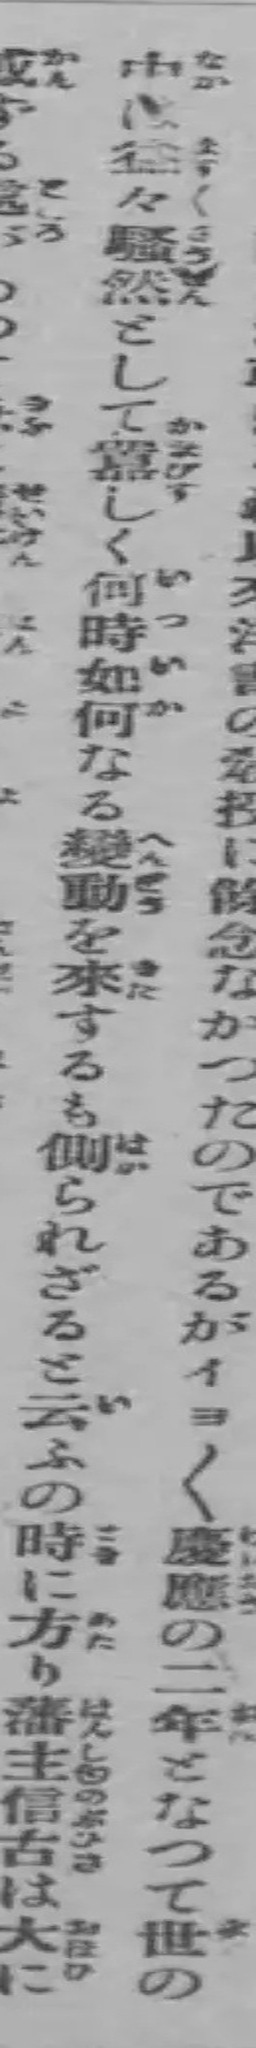中は益々騒然として囂しく何時如何なる変動を来するも側られざると云ふの時に方り藩主信古は大に
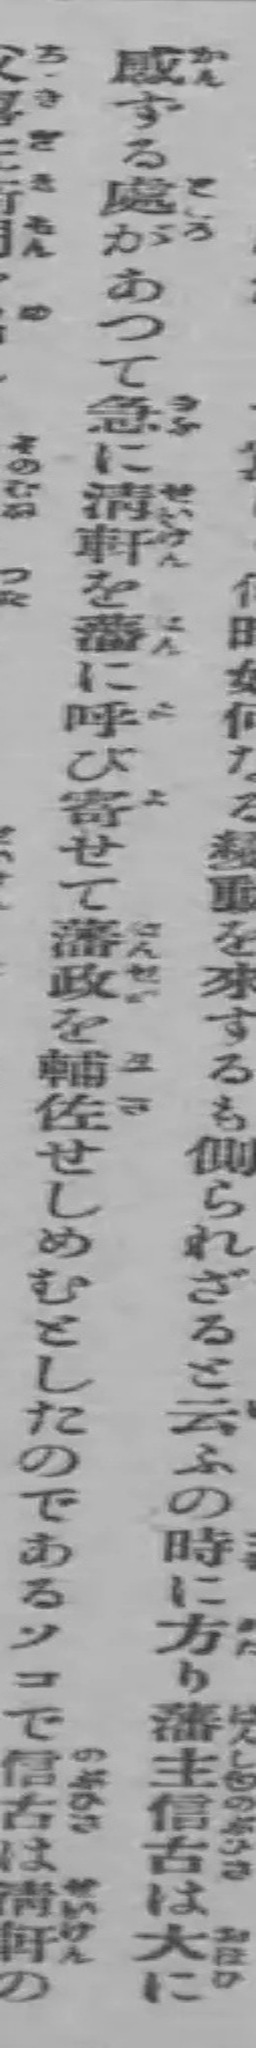感ずる処があつて急に清軒を藩に呼び寄せて藩政を補佐せしめむとしたのであるソコで信古は清軒の
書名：豊橋市史談
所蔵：国立国会図書館 National Diet Library, JAPAN
